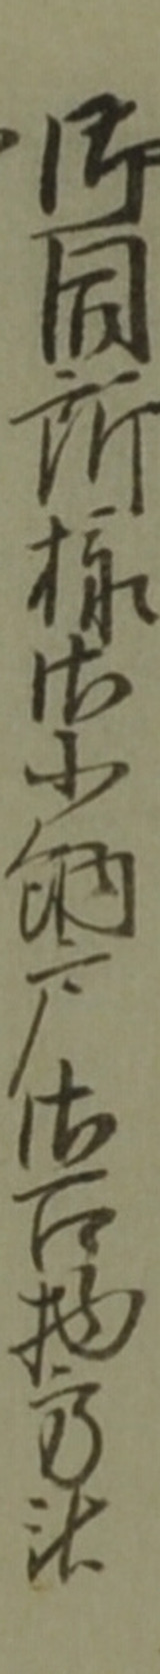御同所様御小納戸御召物方被
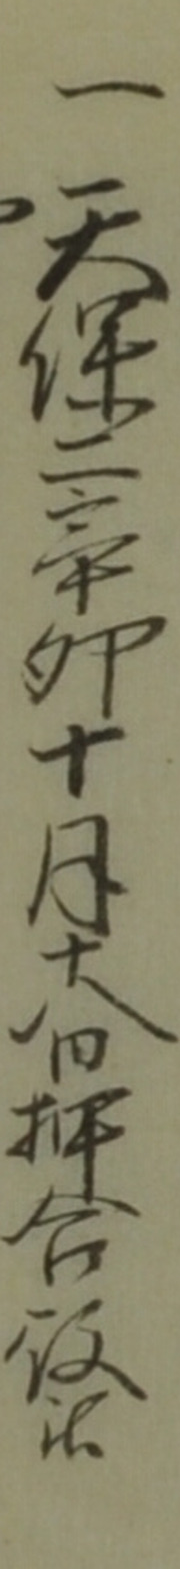一天保二辛卯十月十八日押合役被
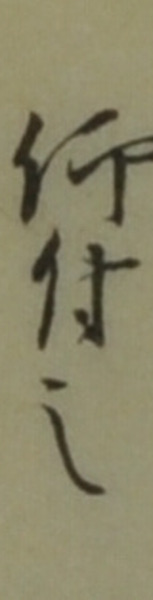仰付之
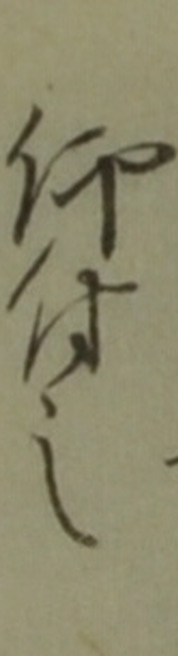仰付之
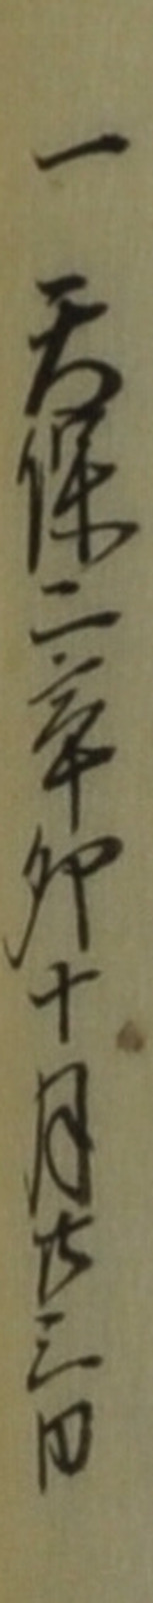一天保二辛卯十月廿三日
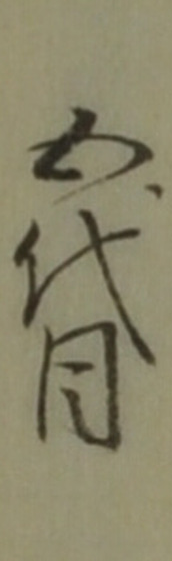五代目
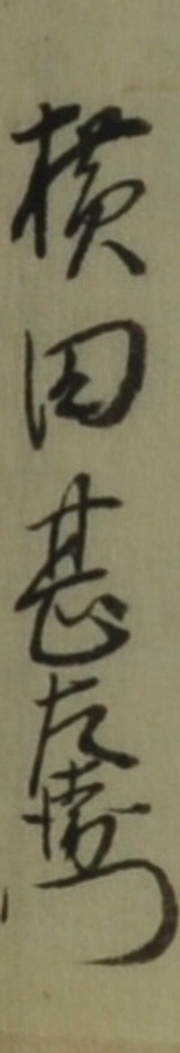横田甚左衛門
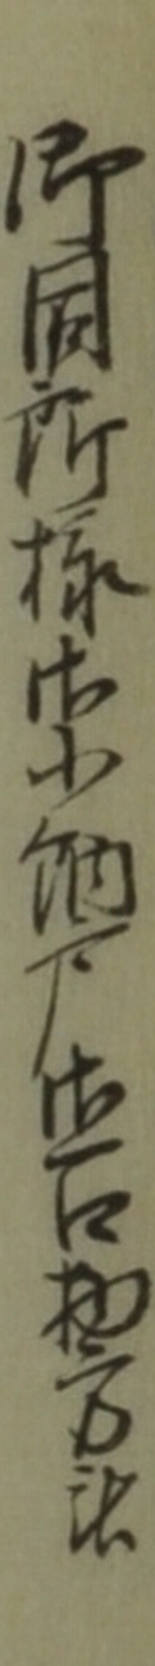御同所様御小納戸御召物方被
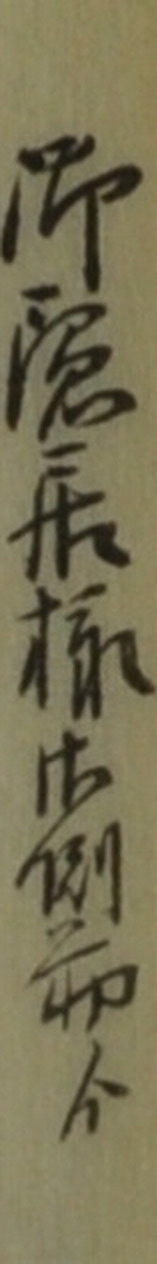御隠居様御側勤ゟ
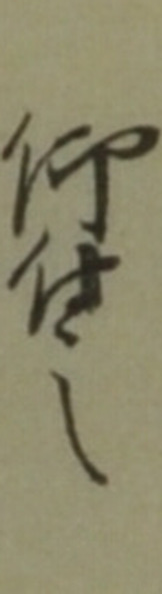仰付之
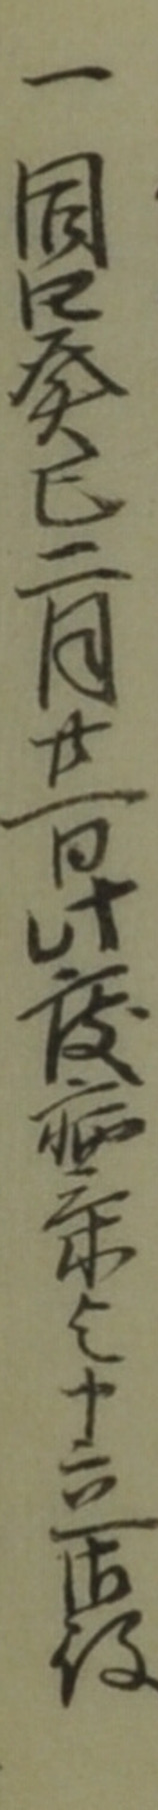一同四癸巳二月廿一日此度病気与申立御役
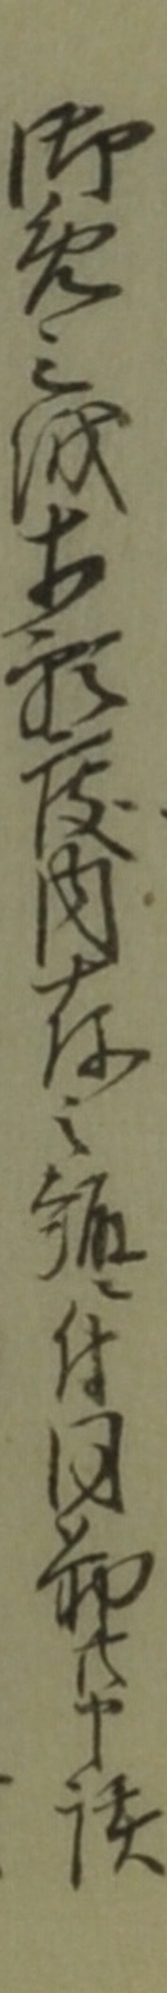御免之儀相願度内存之趣ニ付同勤共申談
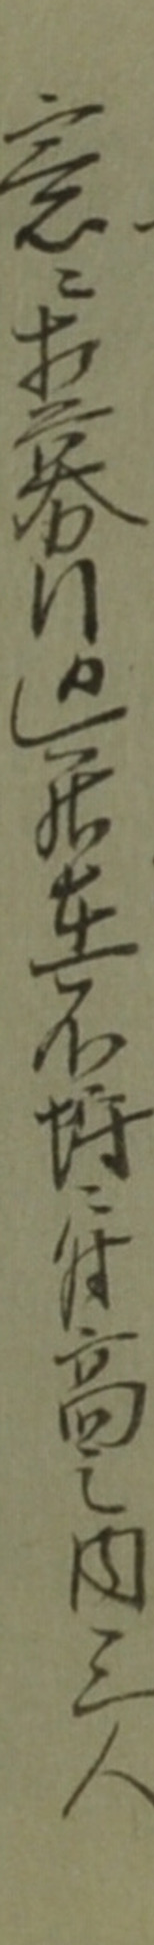意ニ相募引込罷在不埒ニ付高之内三人
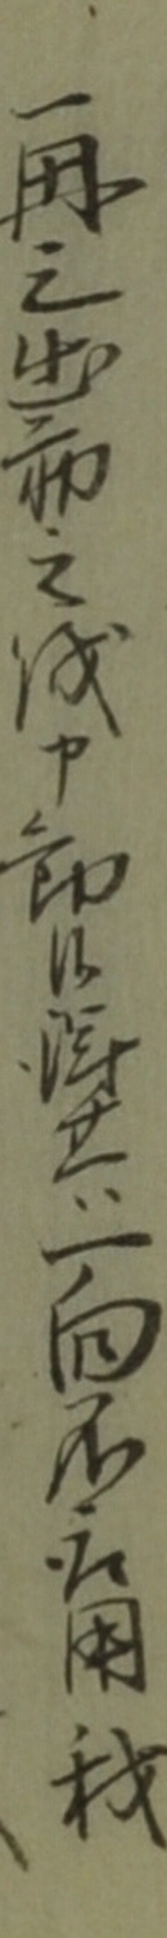再三出勤之儀申勤候得共一向不取用我
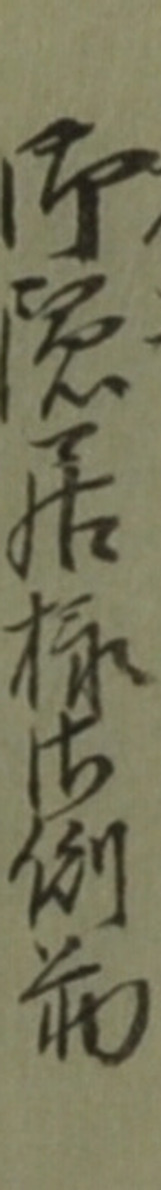御隠居様御側勤
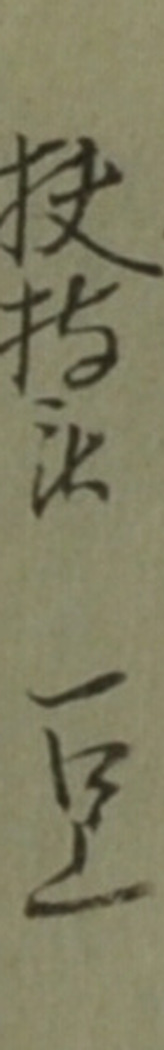扶持被召上
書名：諸御役代々録（四）
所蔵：伊那市立高遠町図書館・合同会社AMANE
